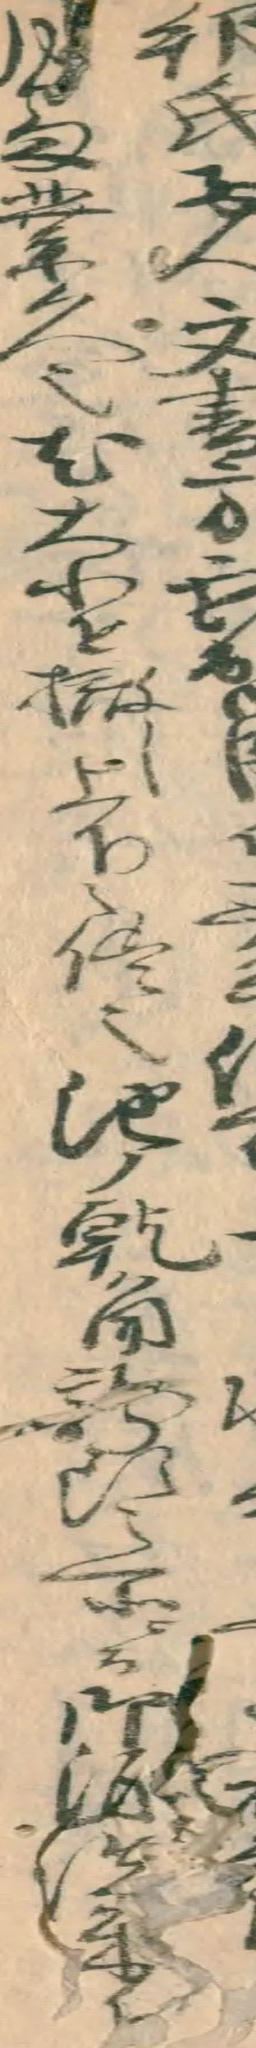月番業久也尤大小を徹し上下之儘也池ノ乾角龍頭之所ニ而御酒洗米
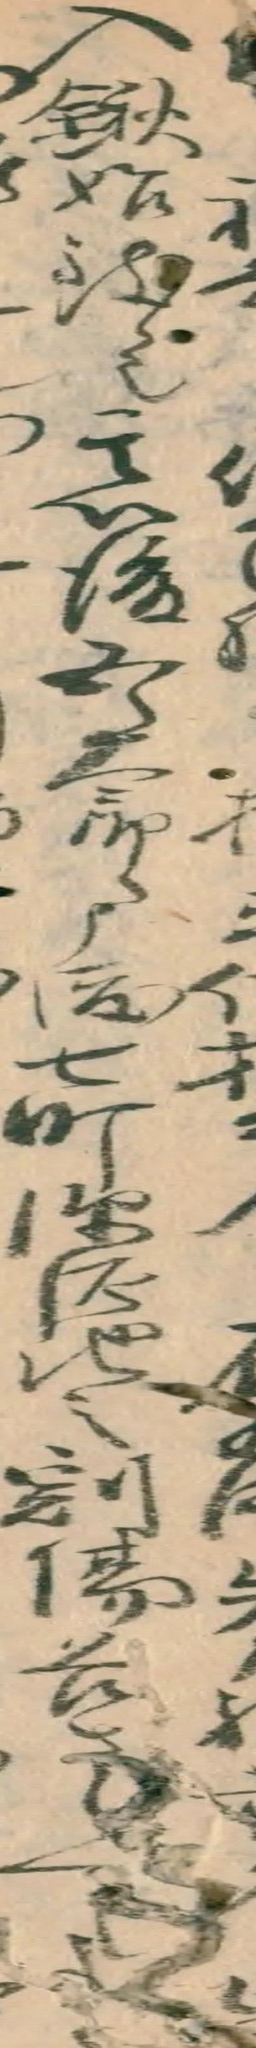入鍬始致候也其以後五郎太郎へ申渡七町深泥池之割場谷さらへ
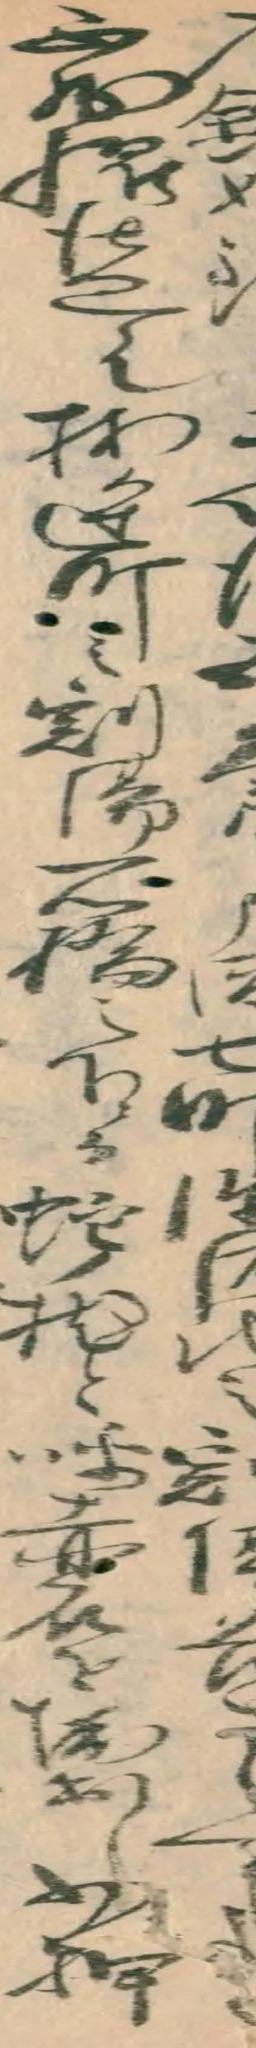不残擢仕廻候て梅か辻町之割場石橋之下ニ而蛇ノと呼赤石を掘出し少押
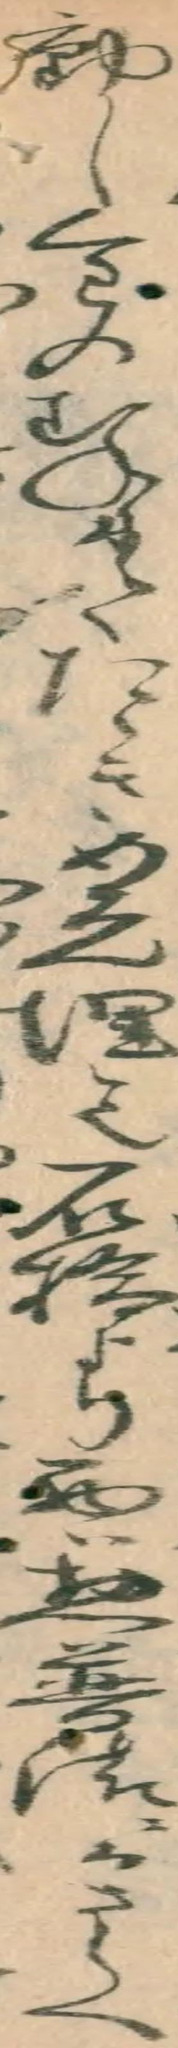動しくわのむねもてたゝき如元埋候也石橋より西ハ惣普請ニ而さらへ
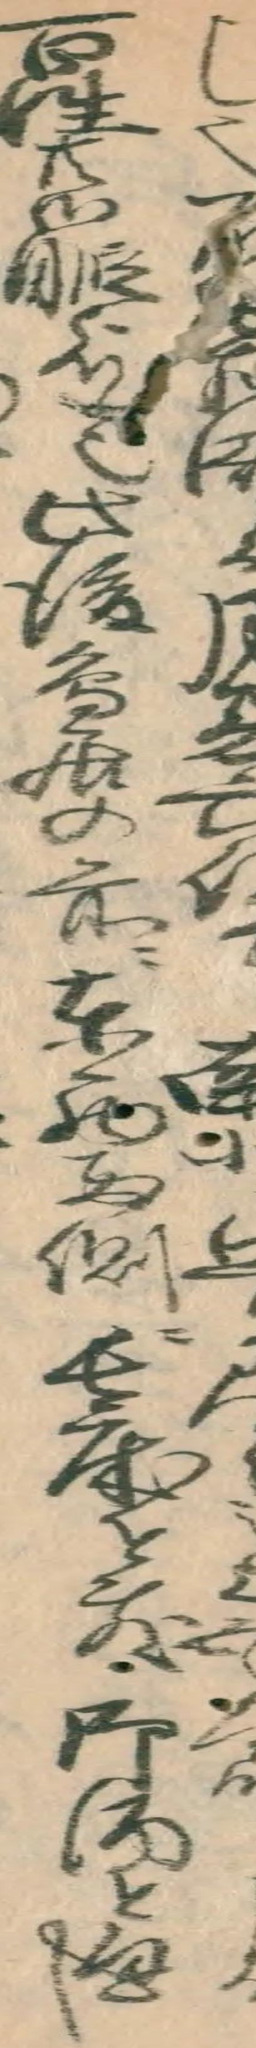百姓共御暇被下候也此後鳥居の前ニ東西両側ニ長床を敷御酒を通し
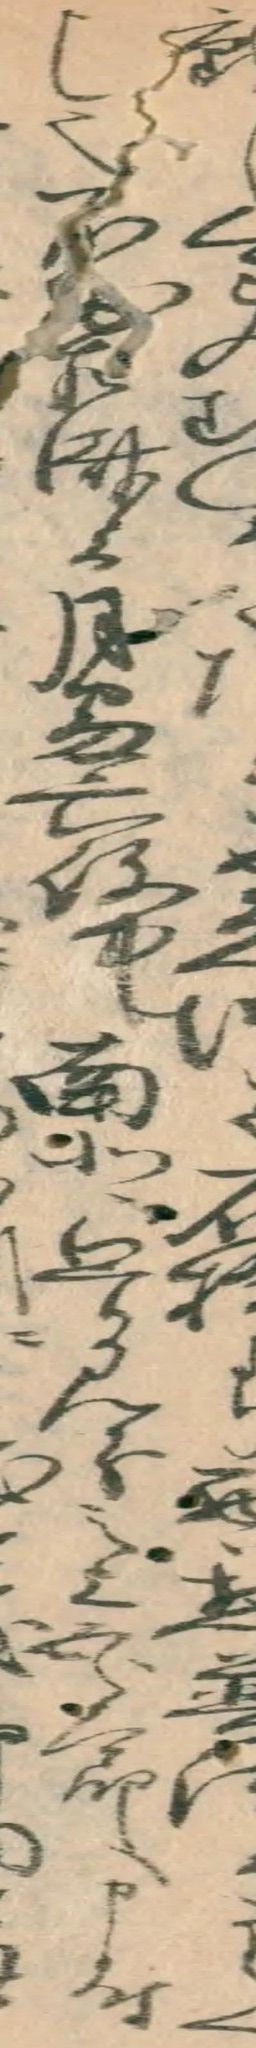申候也不相済候而月番六役中南北へ廻り見分之上五郎太郎へ申付
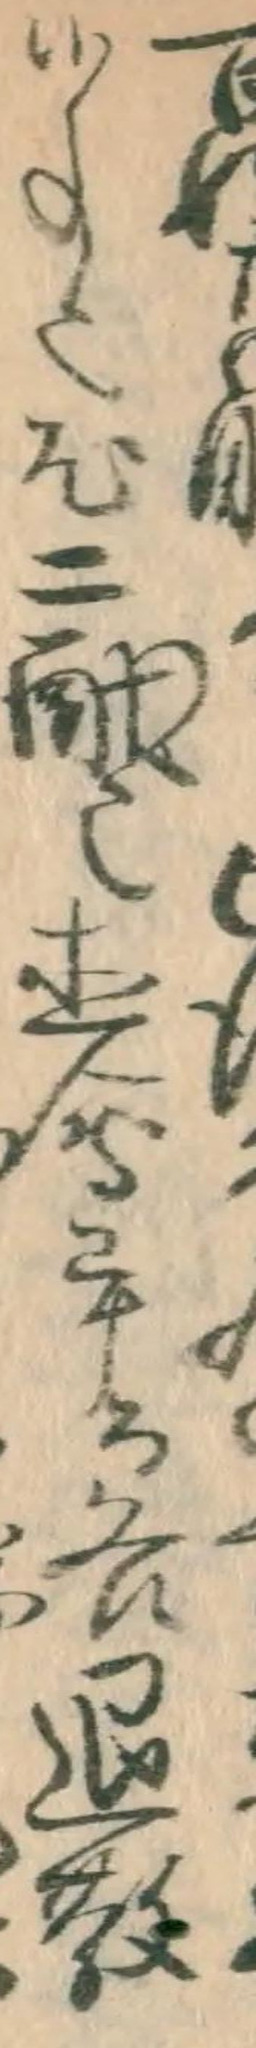候事也尤二献也直会畢而各退散
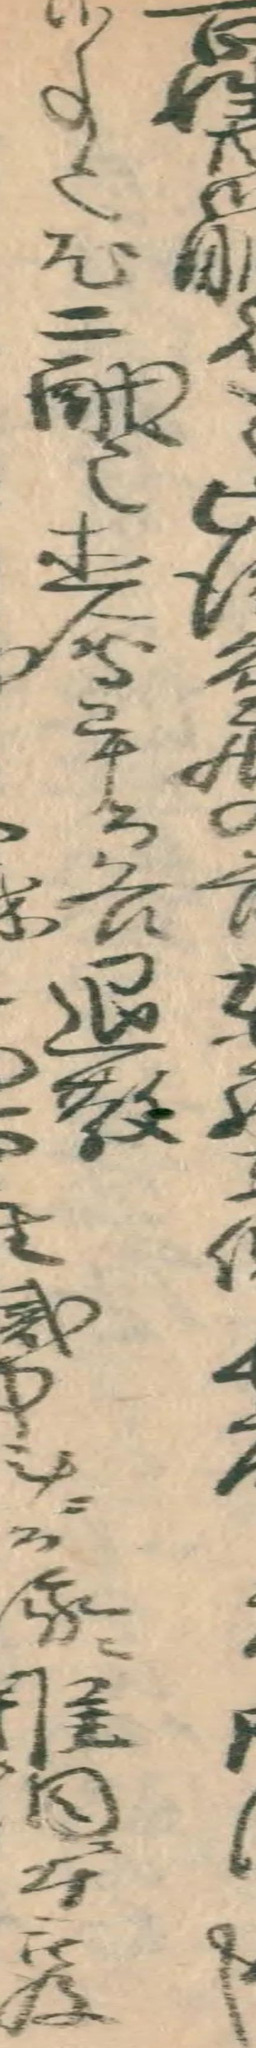候事也尤二献也直会畢而各退散
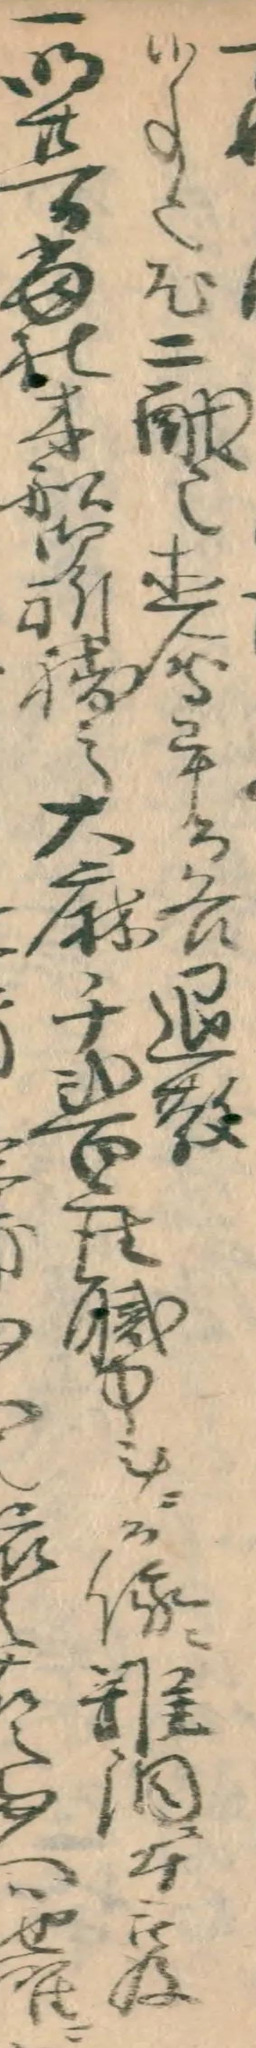一明廿一日当社木船御祈祷之大麻千弐百座職中計ニ而俄ニ難調ニ付被及
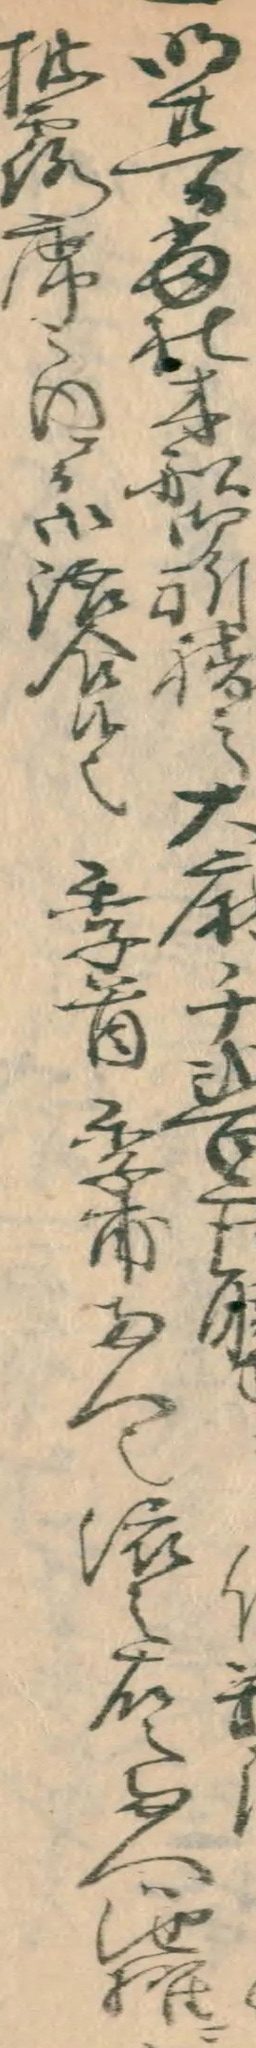披露席之内ニ而御語合候也季首季甫両人也依之右之両人ハ池擢ニハ
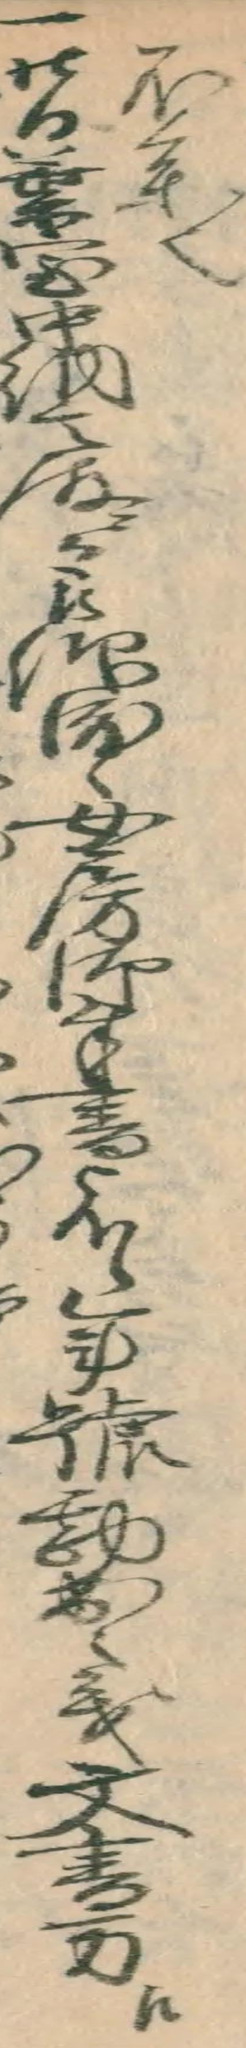一昨日葉室中納言殿ニ而被仰渡候女房御奉書被下候年号勘出之義文書方江
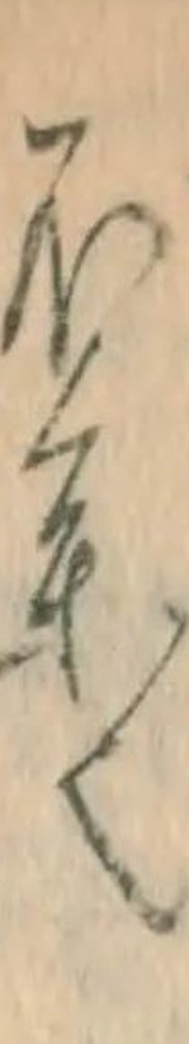不参也
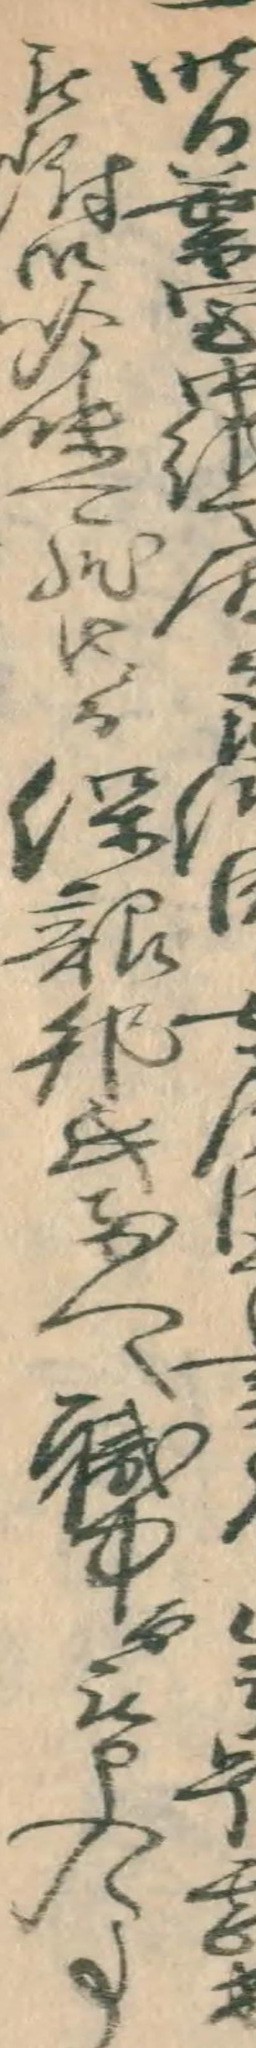被付御吟味可然由ニ而保韶邦氏両人へ職中ゟ被申入候事
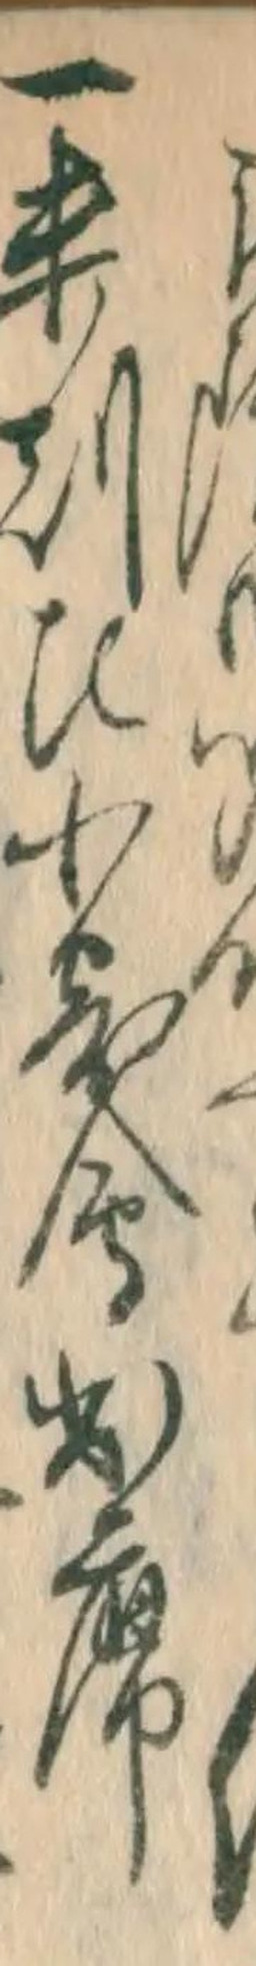一未ノ刻比小寄会出席
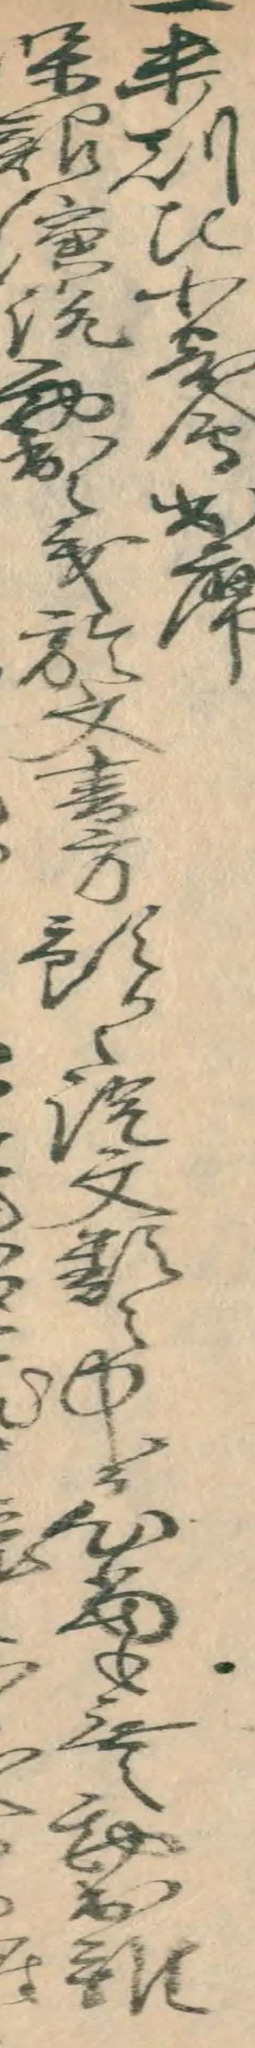保韶演説勘出之義於文書方預り之証文類之中ニ而心当も無之勘出難
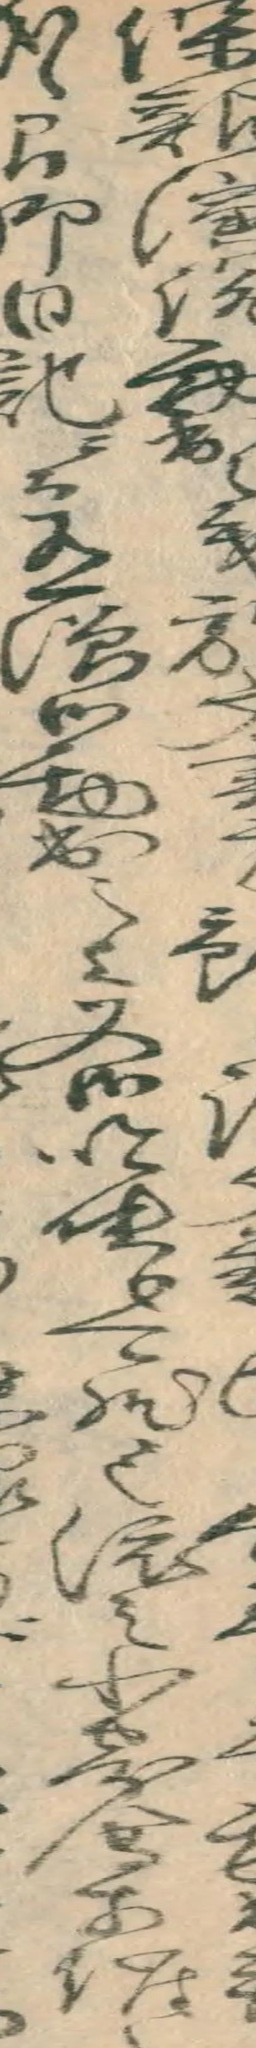成候間御日記ニ而有増御勘出之上又御吟味も可然候也依之小寄会相催候
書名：賀茂社記録. 第58冊
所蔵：国立国会図書館 National Diet Library, JAPAN
